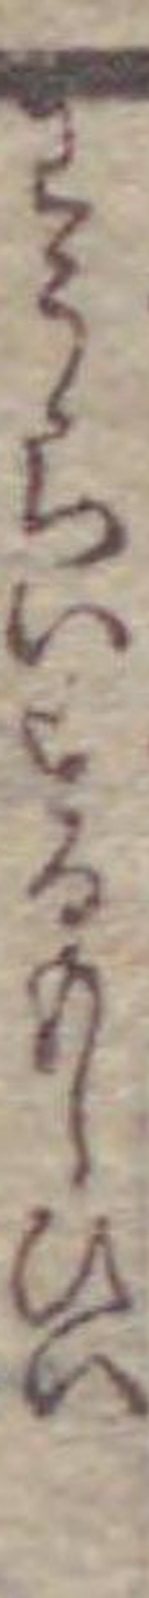わうらいするもしひい
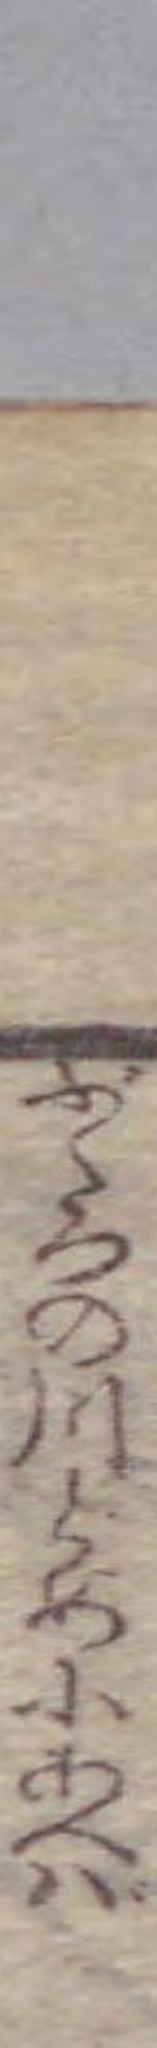ぶくろの川どめにあへば
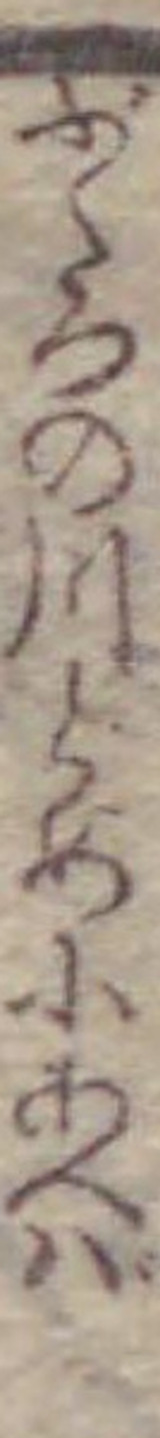ぶくろの川どめにあへば
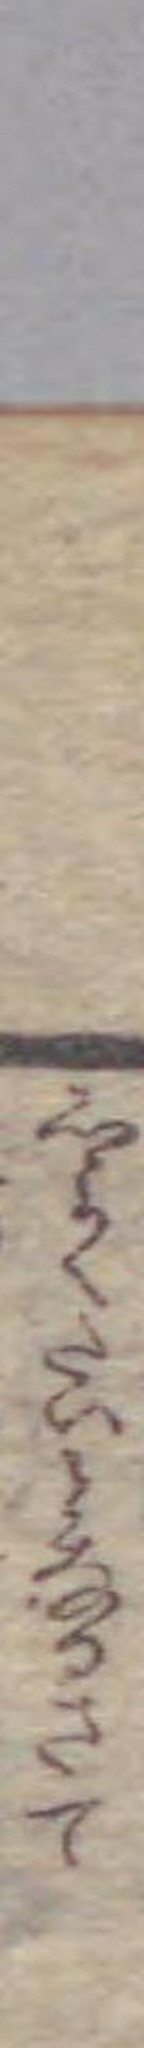しよくたいとなるさて
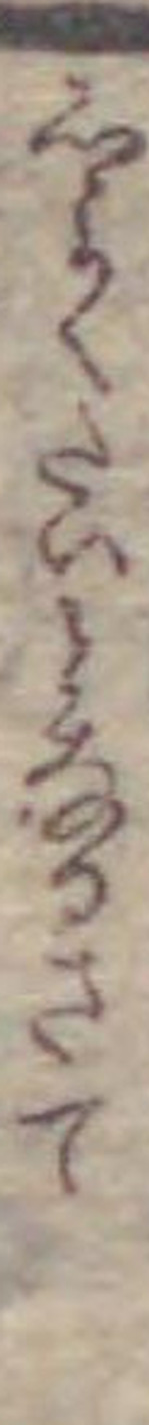しよくたいとなるさて
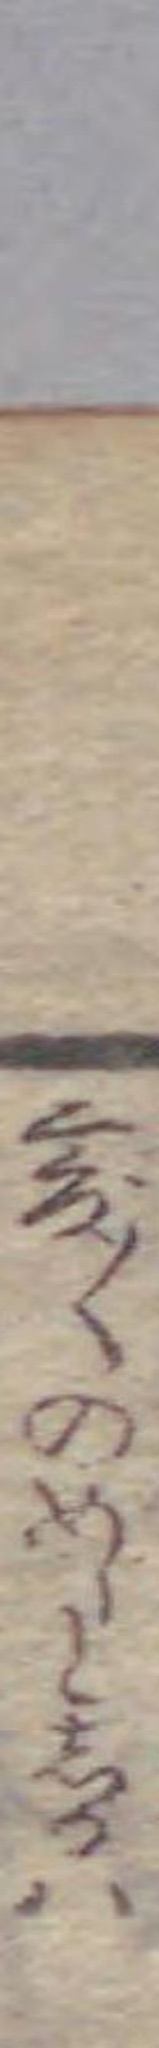二度〳〵のめしとしるは
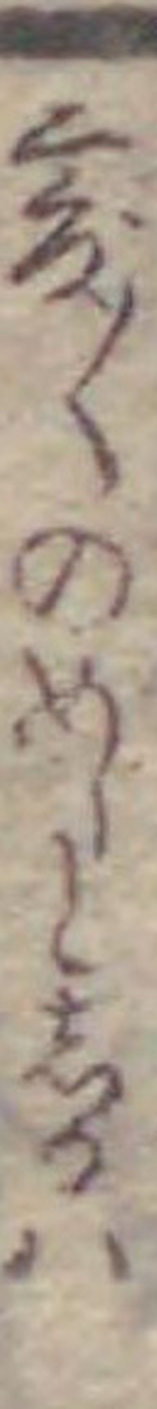二度〳〵のめしとしるは
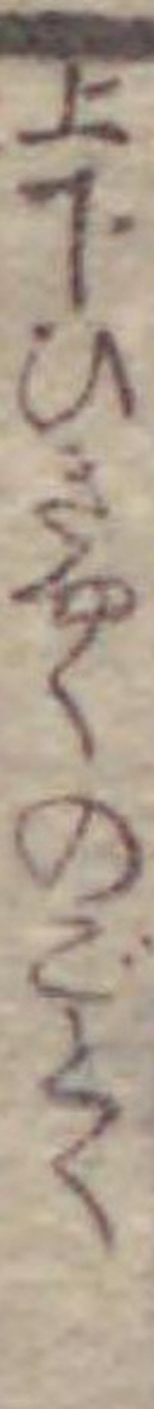上下ひきやくのごとく
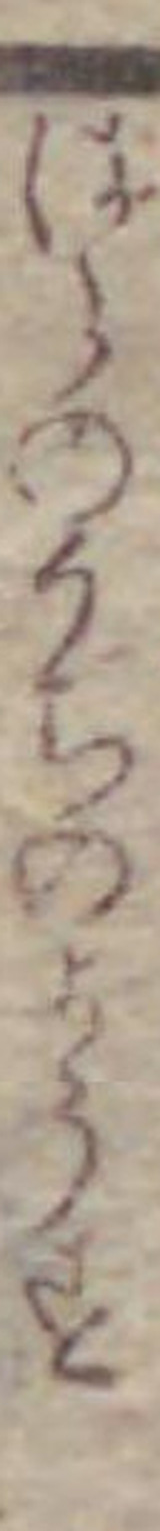はらのうちのようす
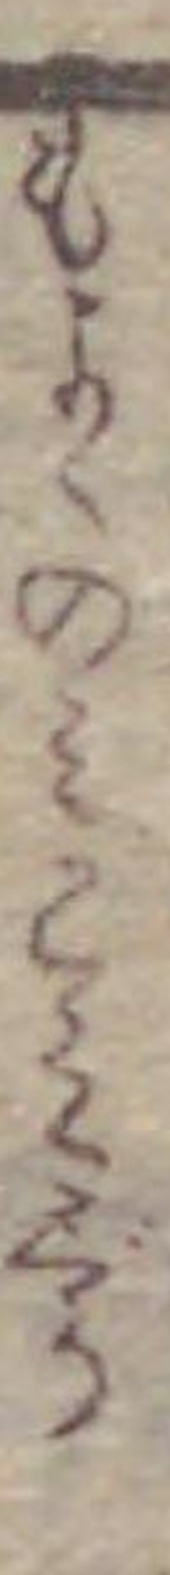もよくのみこみだう
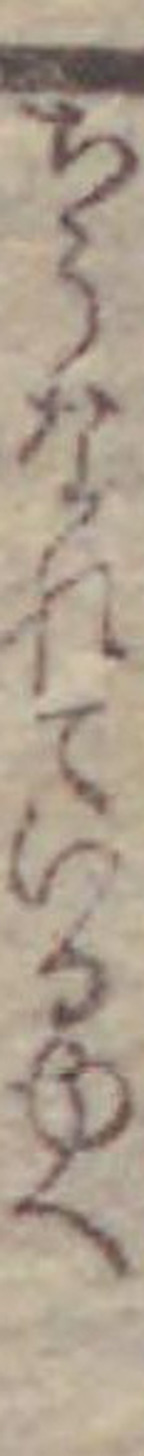ちうなれているゆへ
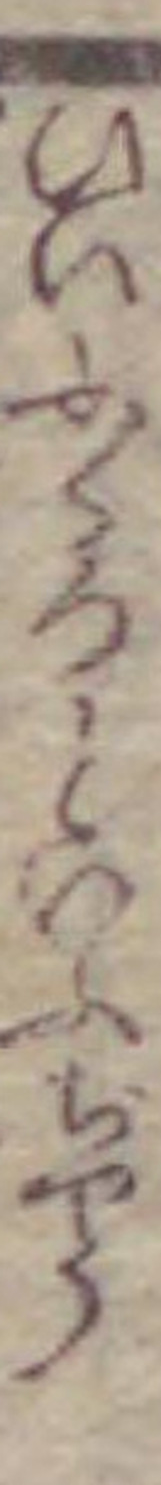ひいふくろといふぢやう
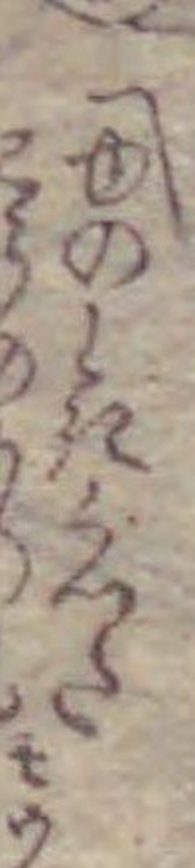〽ゆのときくつた
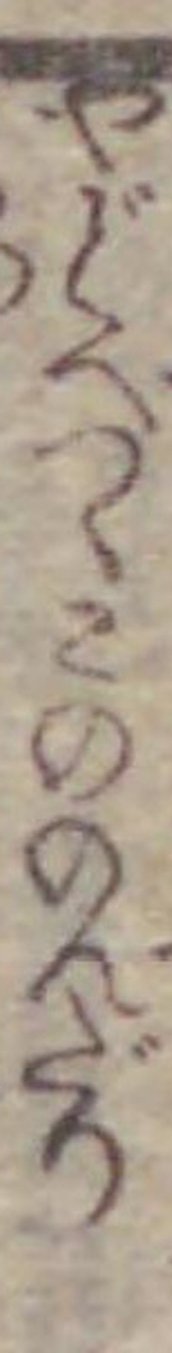やどへつくこののんだり
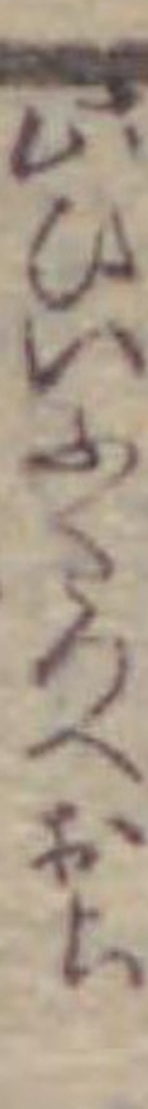此ひいふくろへおち
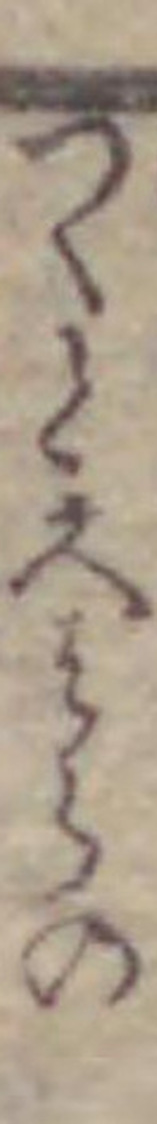つくと大そらの
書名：鼻下長生薬 : 3巻
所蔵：国立国会図書館 National Diet Library, JAPAN
